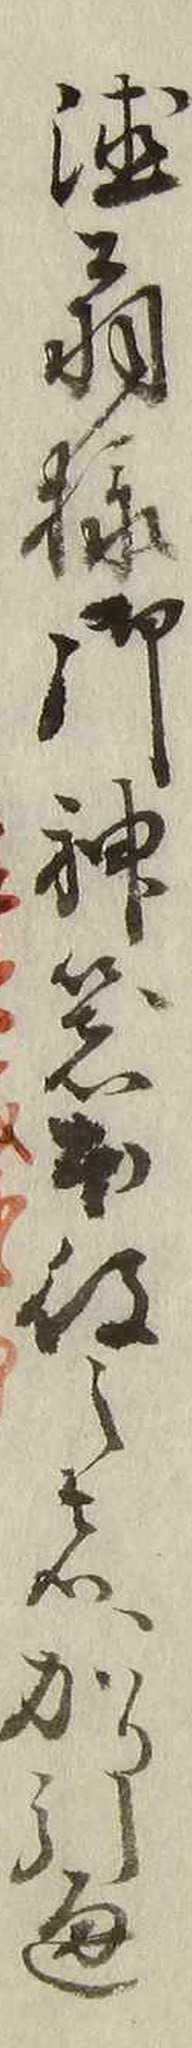徳翁様門神器本役之者へ加り引通
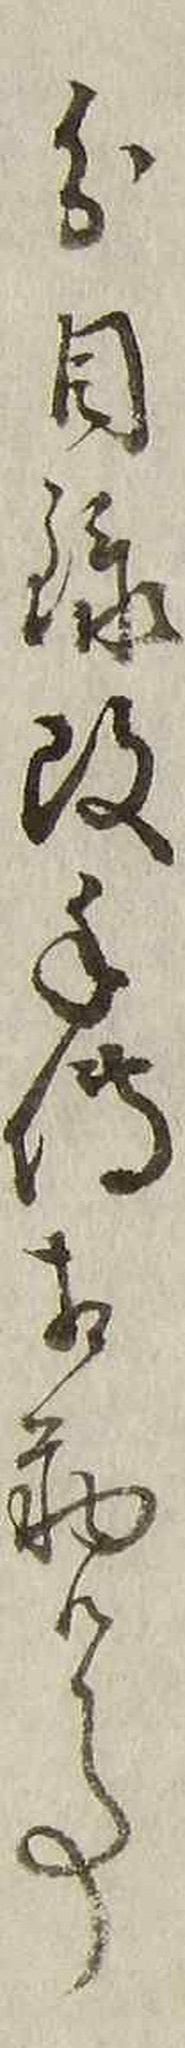分目録改手伝相勤候事
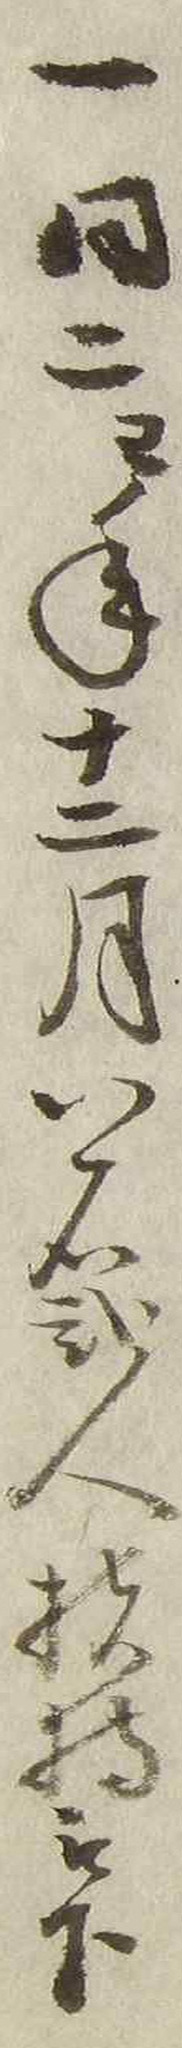一同二巳年十二月八石弐人扶持被下

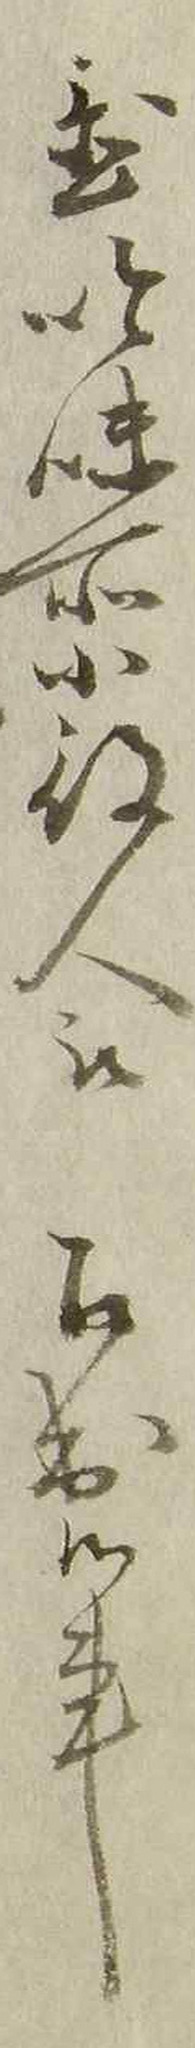置吟味所小役人被召出候事
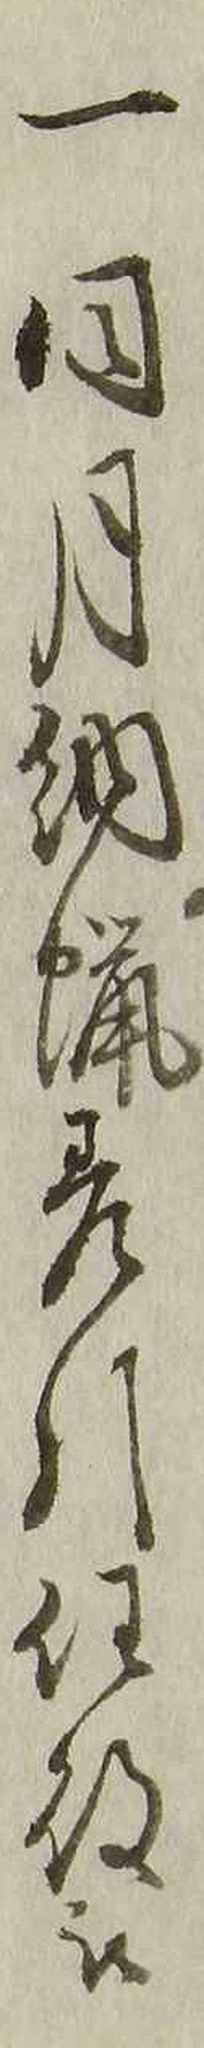一同月納蝋差引任役被
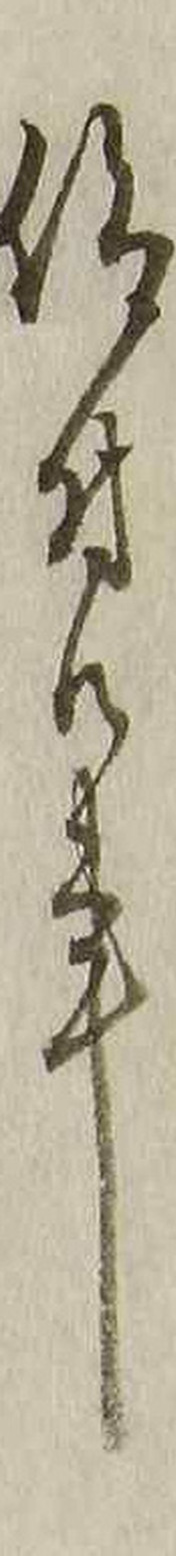仰付候事
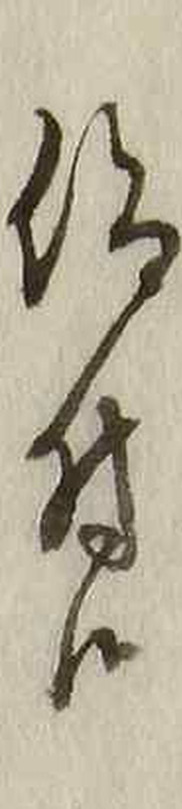仰付候
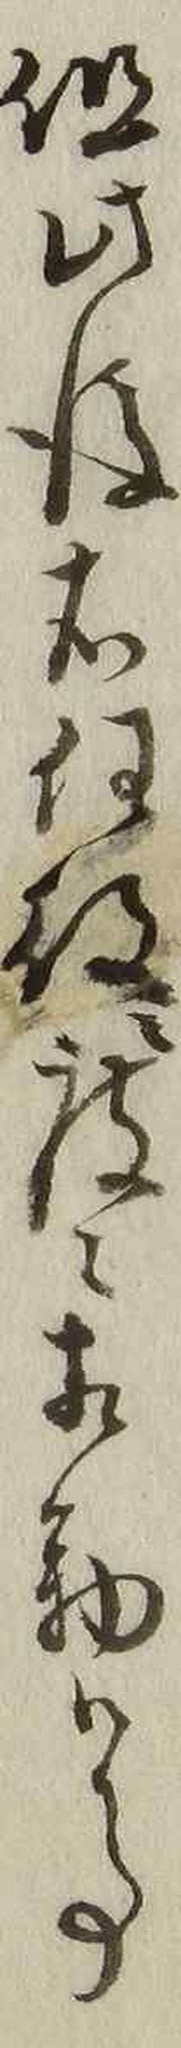但此後右任役ニ度々相勤候事
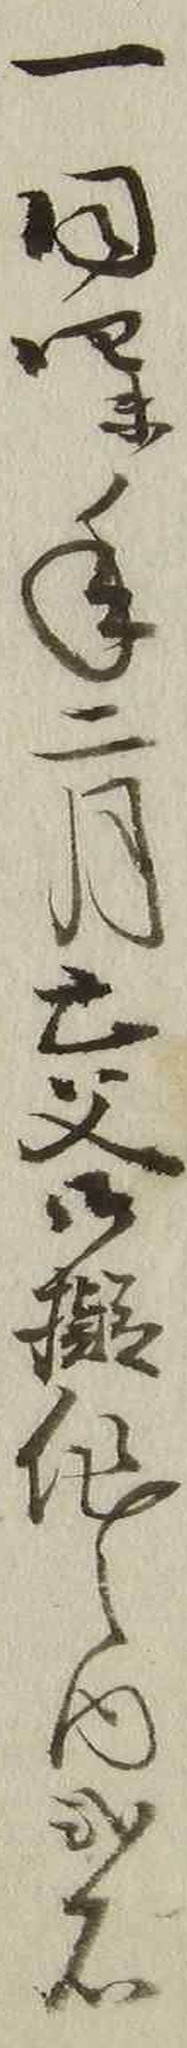一同四未年二月亡父御擬作之内弐石
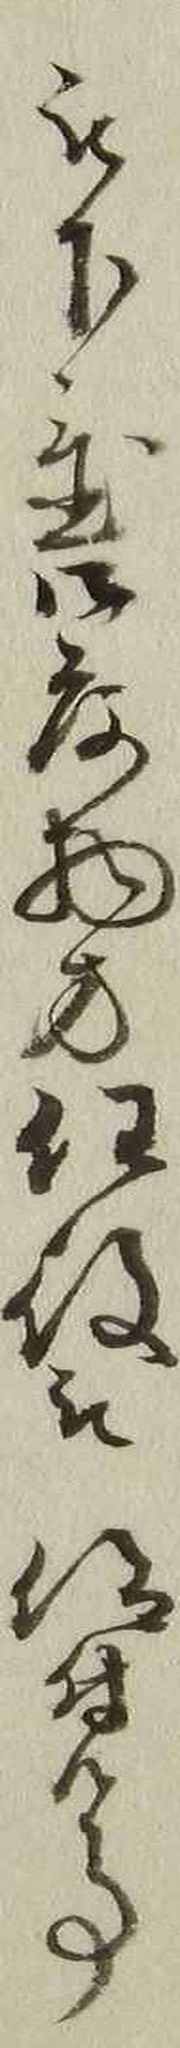被下置御荷物方任役被仰付候事
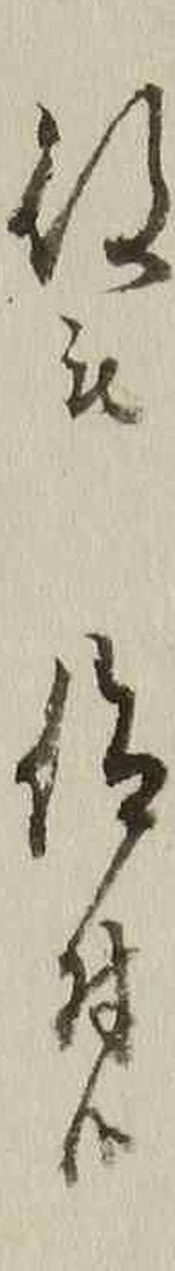役被仰付候
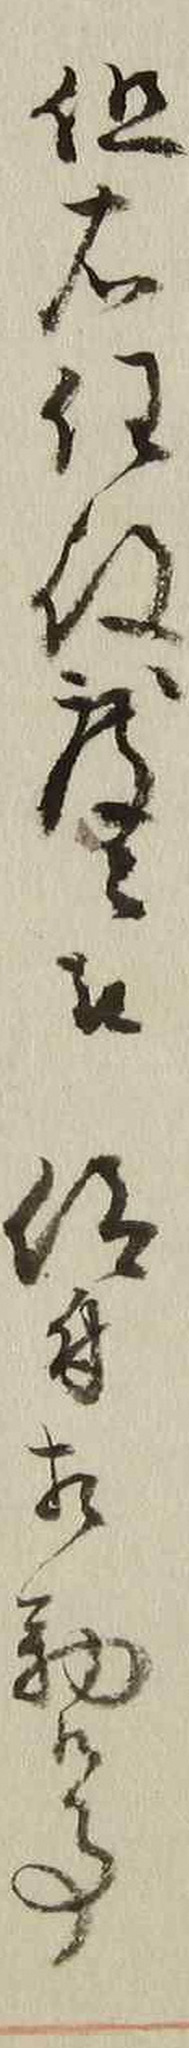但右任役へ度々被仰付相勤候事
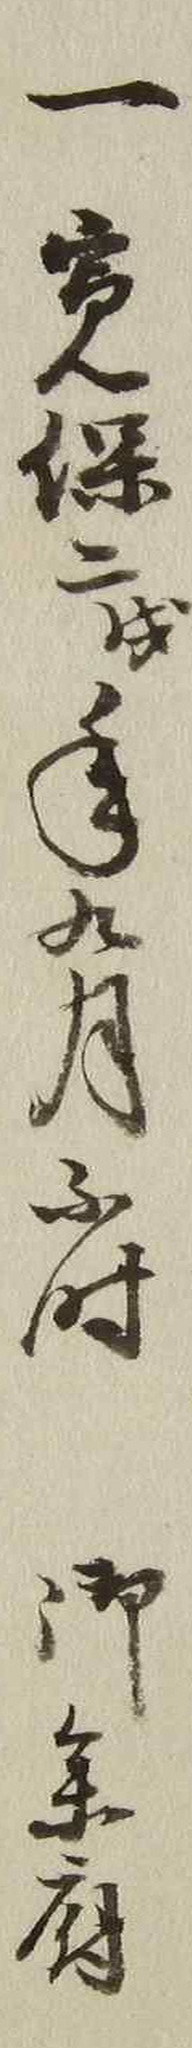一寛保二戌年九月不時御参府
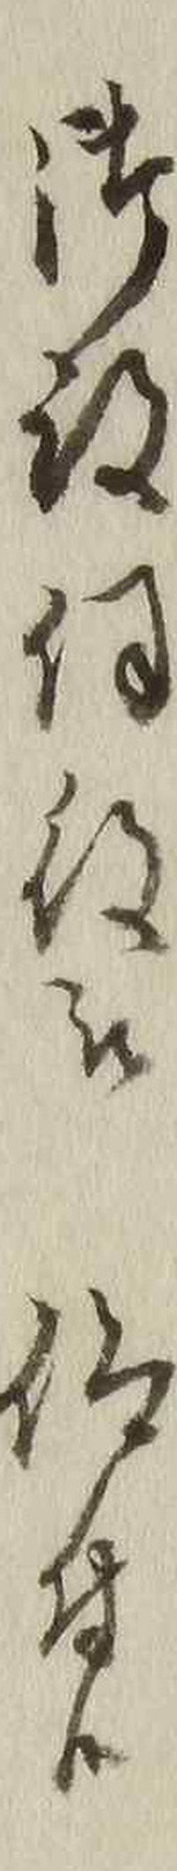御役任役被仰付候
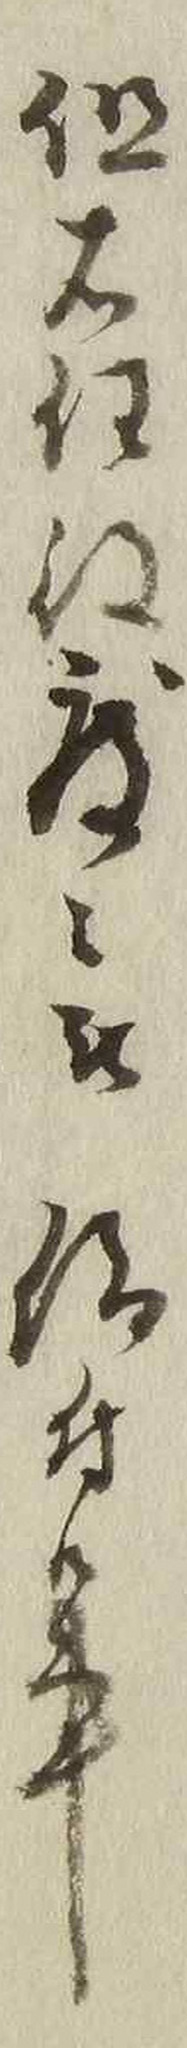但右任役度々被仰付候事
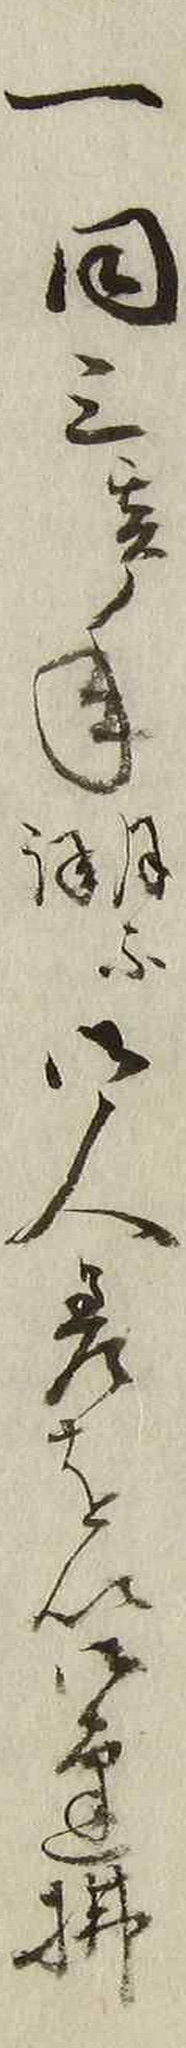一同三亥年月不詳御人差を以御金払
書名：諸士系譜　巻之39　は之部7
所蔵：会津若松市立会津図書館
